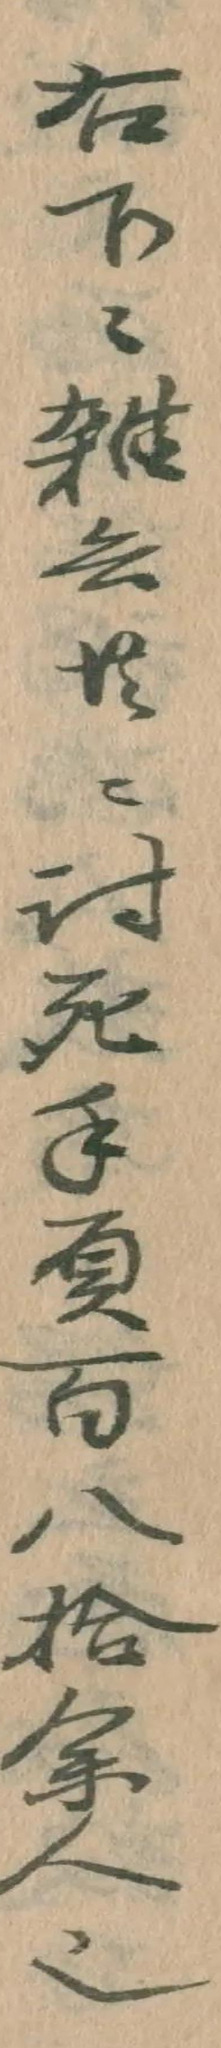右下々雑兵共に討死手負百八拾四人也
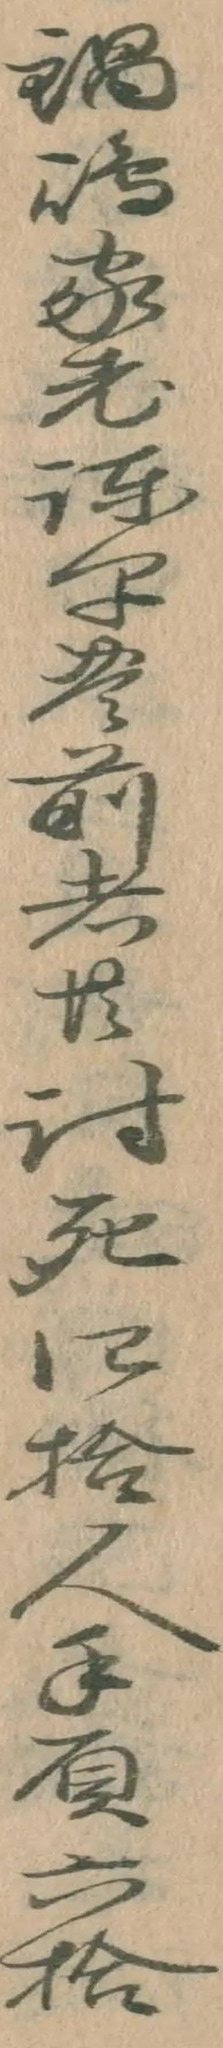鍋島家老諌早豊前者共討死四拾人手負六拾
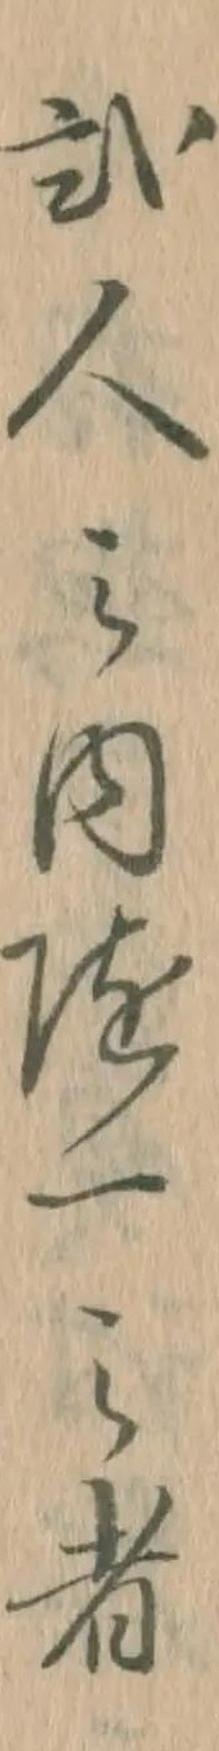弐人之内随一之者
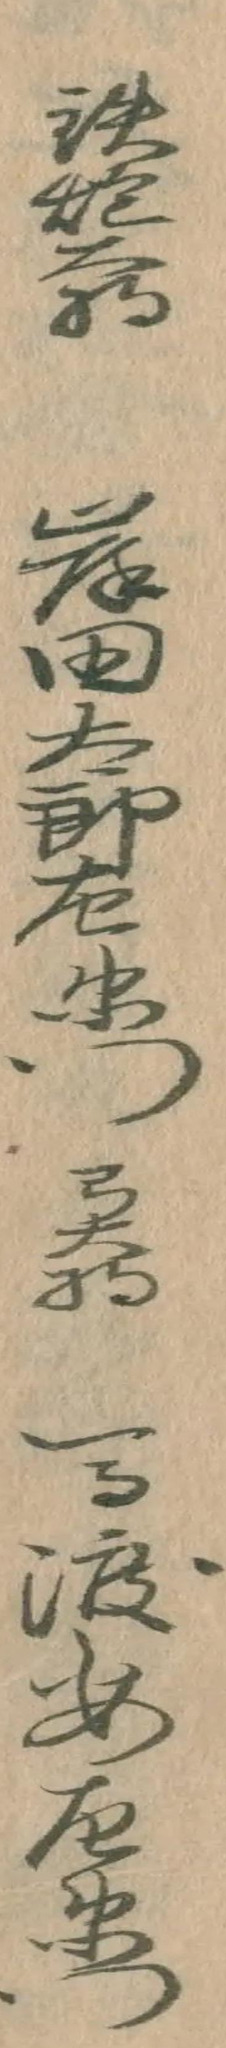鉄炮大将岸田太郎左衛門弓大将馬渡安左衛門
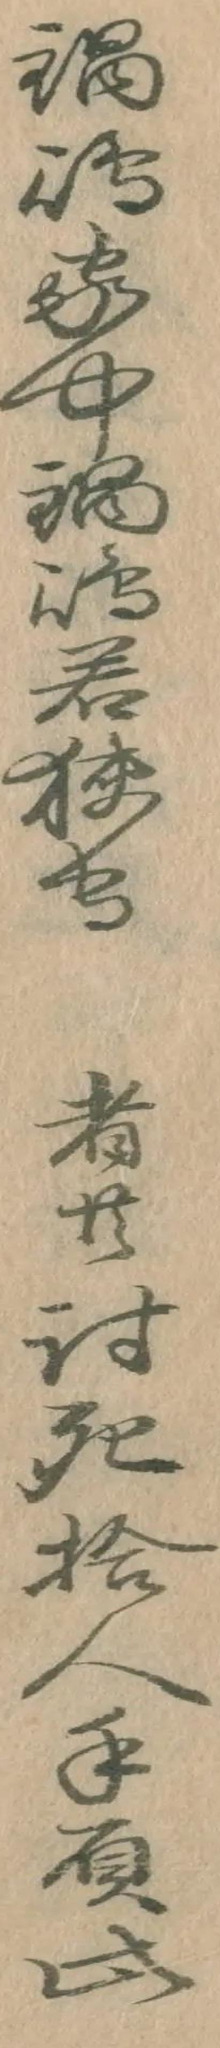鍋島家中鍋島若狭守者共討死拾人手負此
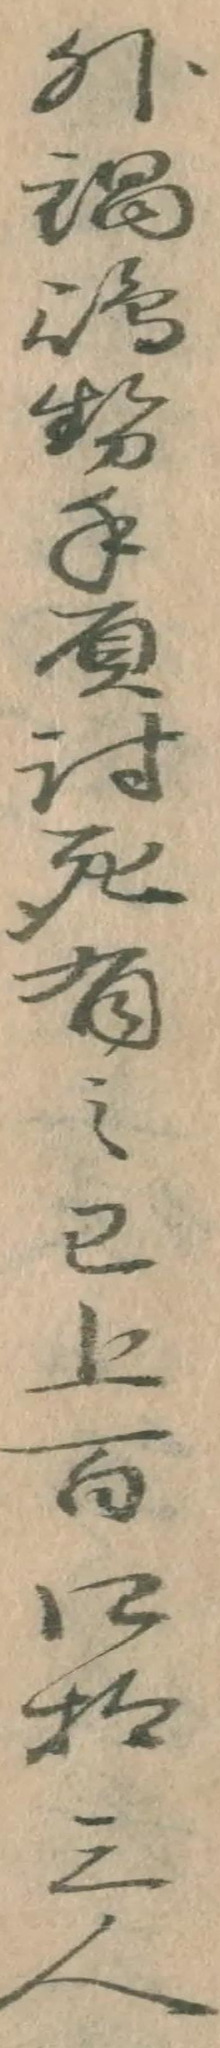外鍋島勢手負討死有之已上百四拾三人
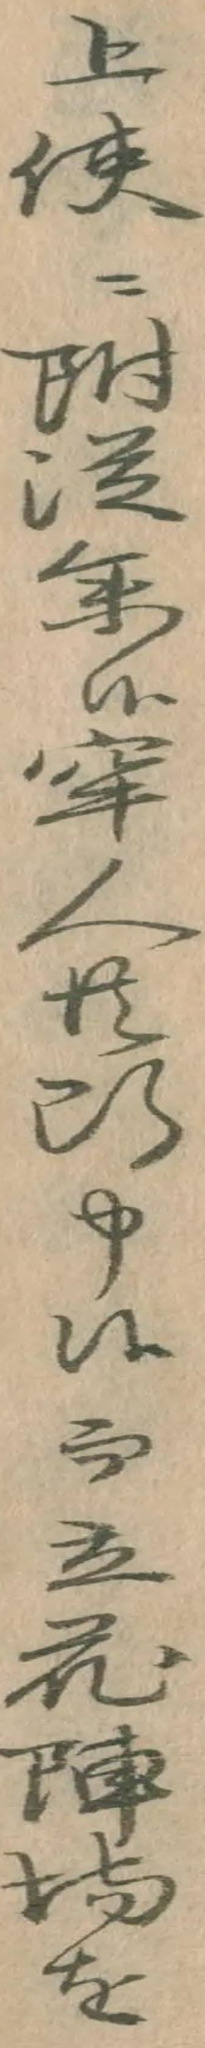上使に附従参候牢人共断申候而立花陣場を
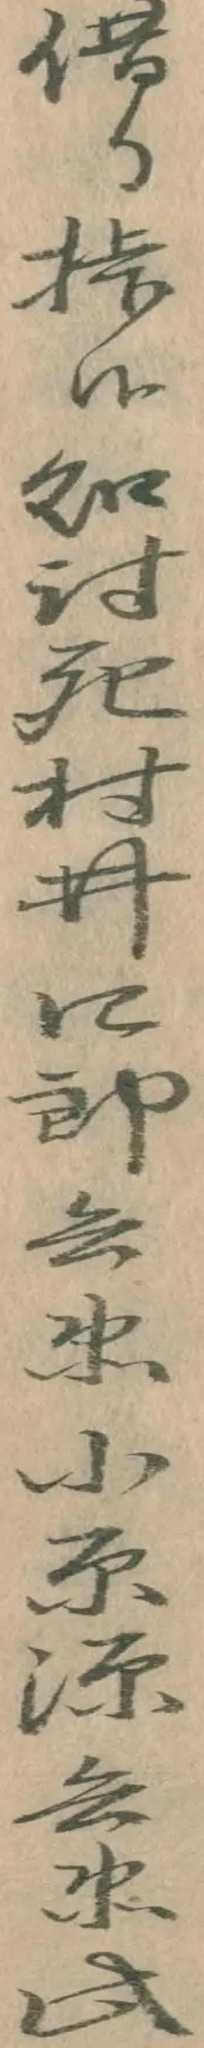借り挊候処討死村井四郎兵衛小原源兵衛此

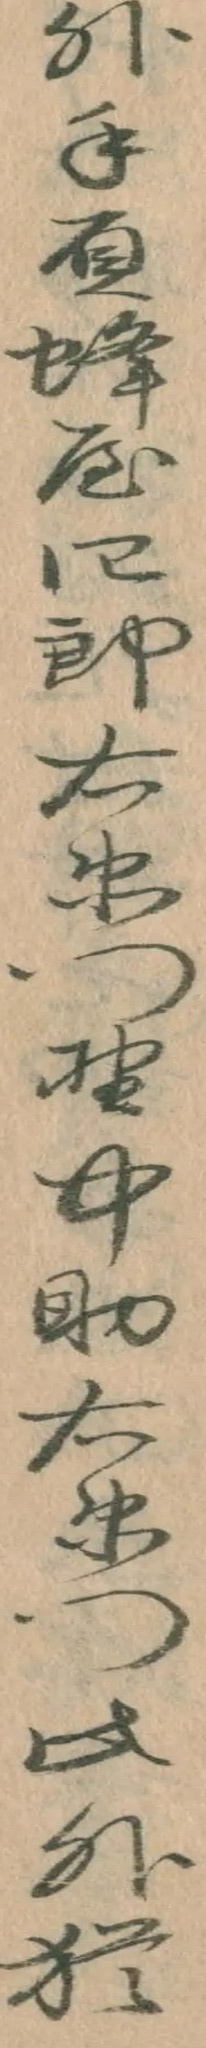外手負蜂屋四郎右衛門野中助右衛門此外猶
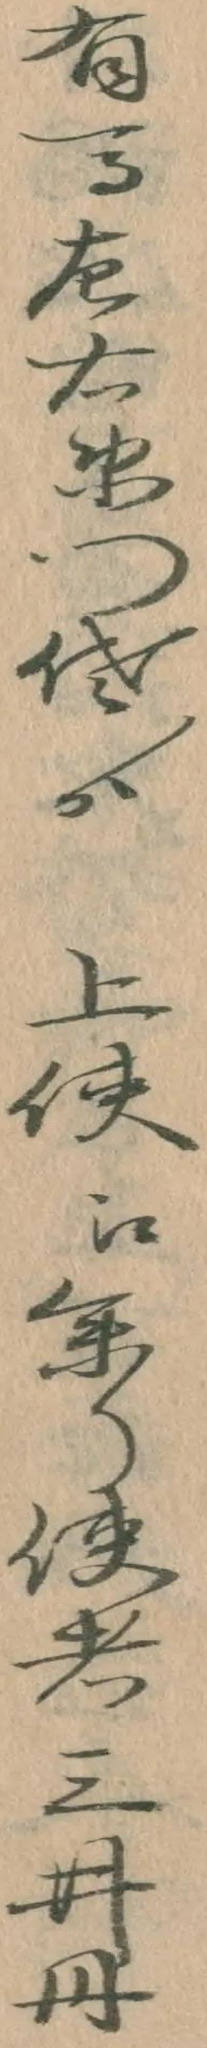有馬左右衛門佐ゟ上使江参り使者三井丹
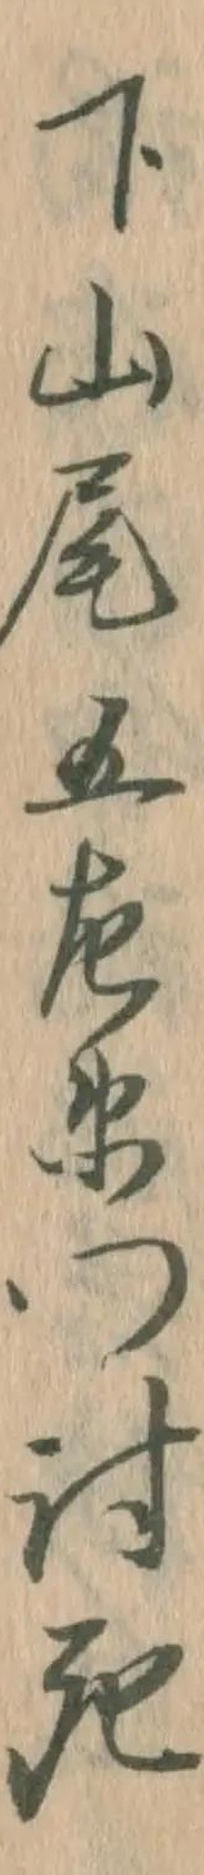下山尾五左衛門討死
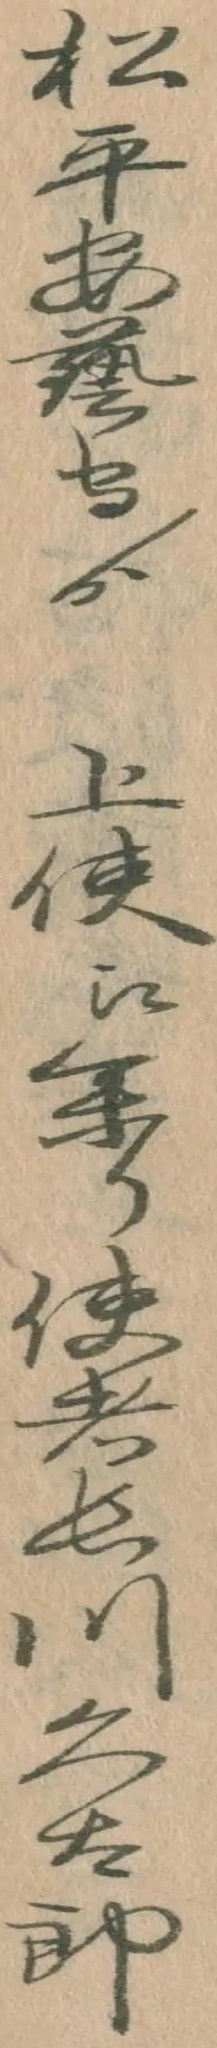松平安芸守ゟ上使江参り使者長川久太郎
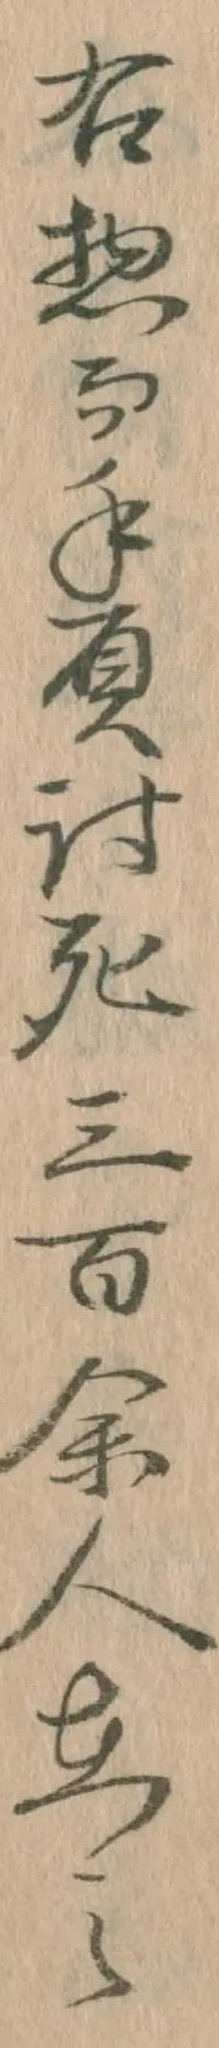右惣字而手負討死三百余人在之
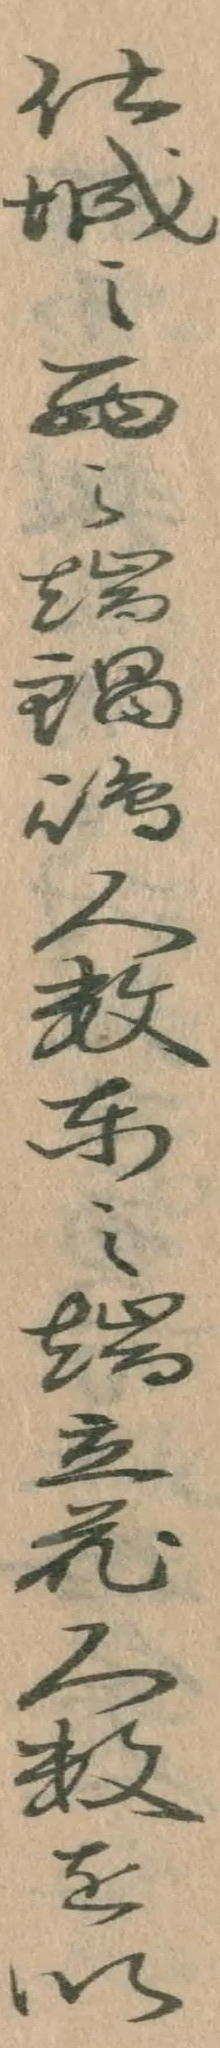仕城之西之端鍋島人数東之端立花人数を以
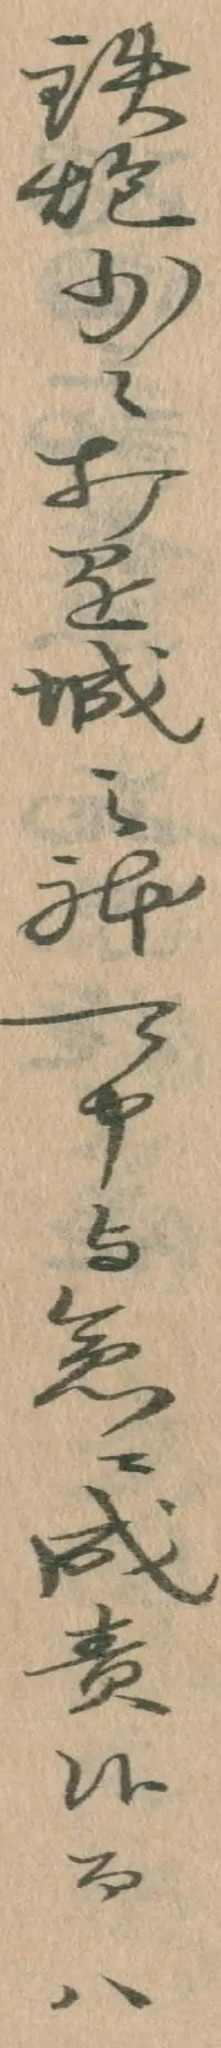鉄炮少々打懸城之躰可申与急に成責候而は
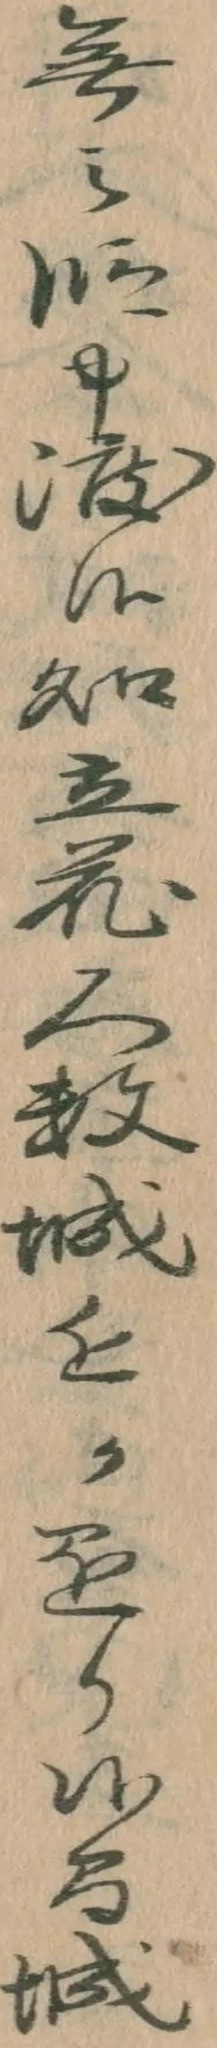無之段申渡候処立花人数城近く懸り候間城
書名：切支丹御退治記 49巻. [4]
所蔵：国立国会図書館 National Diet Library, JAPAN
